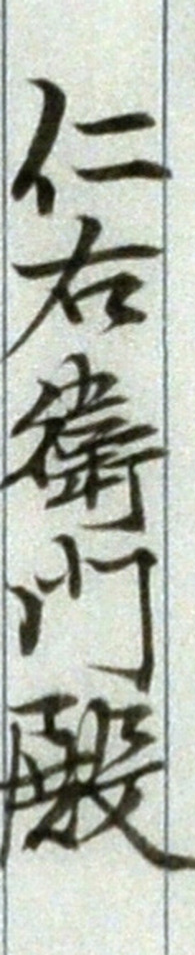仁右衛門殿
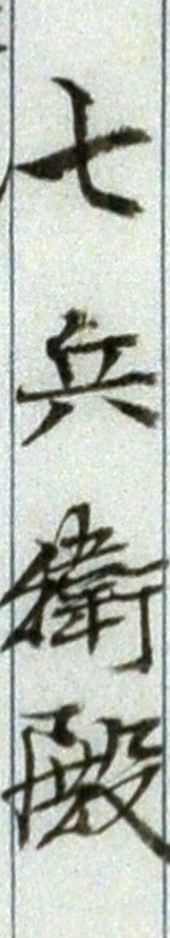七兵衛殿
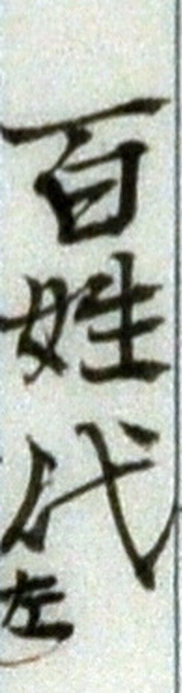百姓代
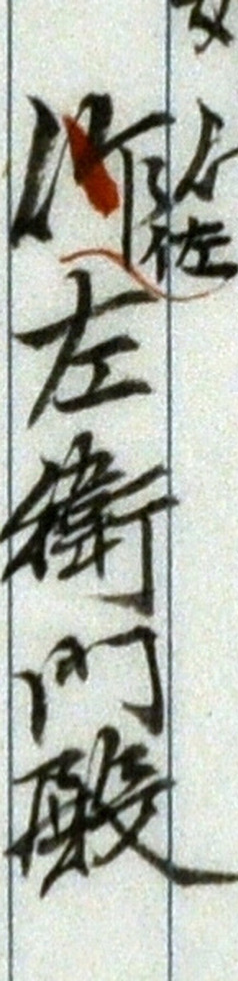仁右衛門殿

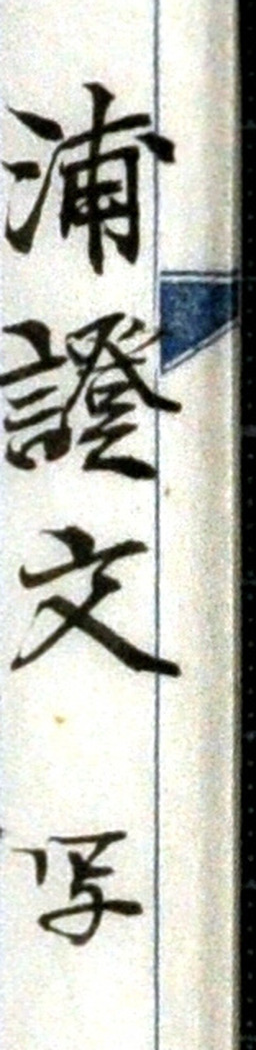浦証文写
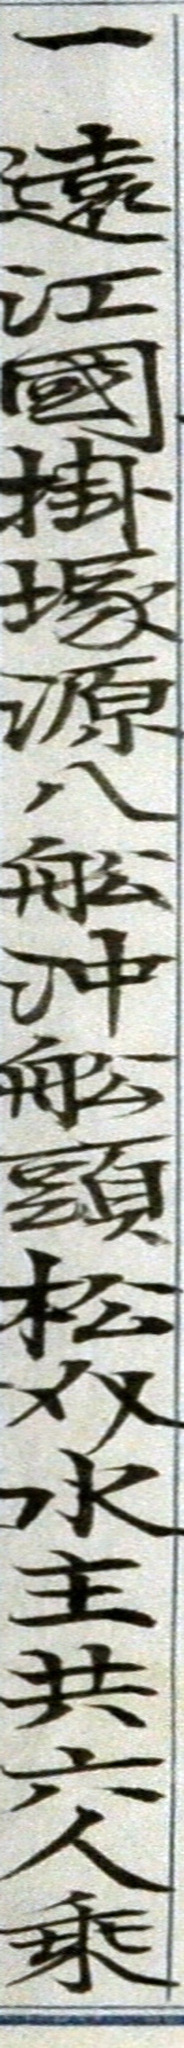一遠江国掛塚源八船沖船頭松介水主共六人乗
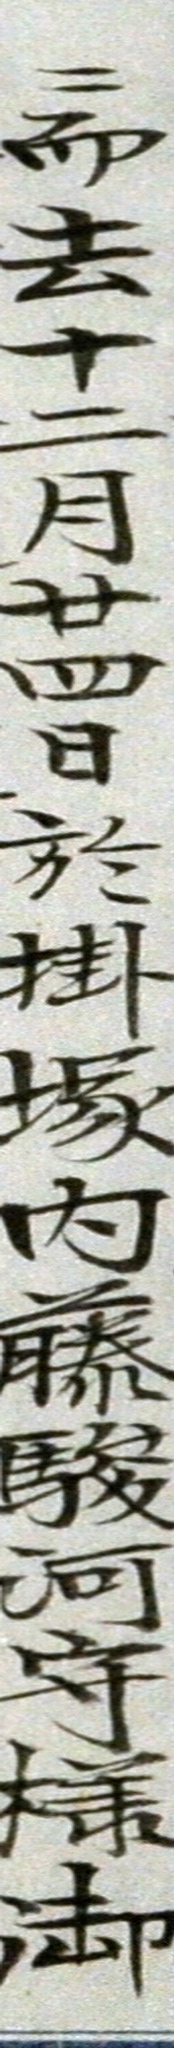に而去十二月廿四日於掛塚内藤駿河守様御
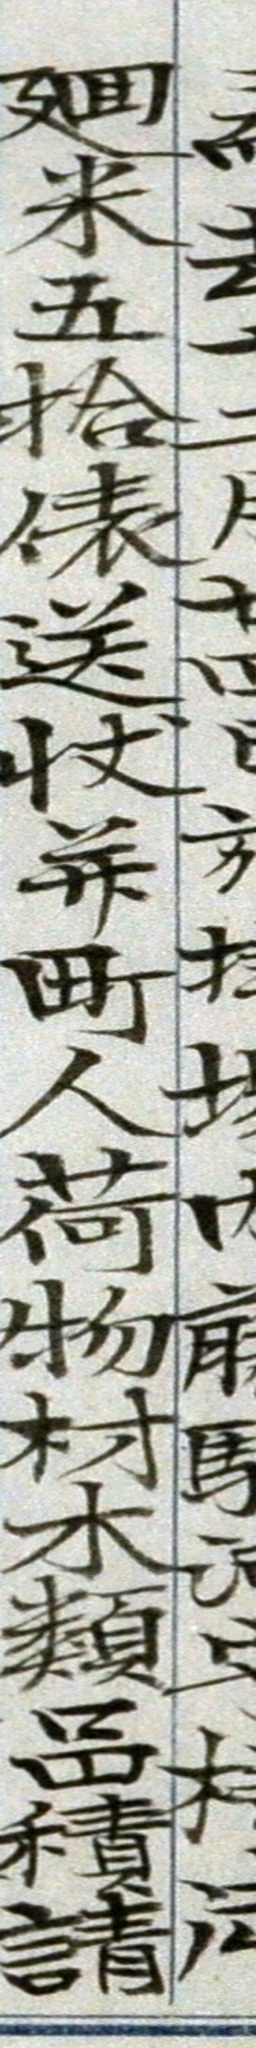廻米五拾俵送状并町人荷物材木類品積請
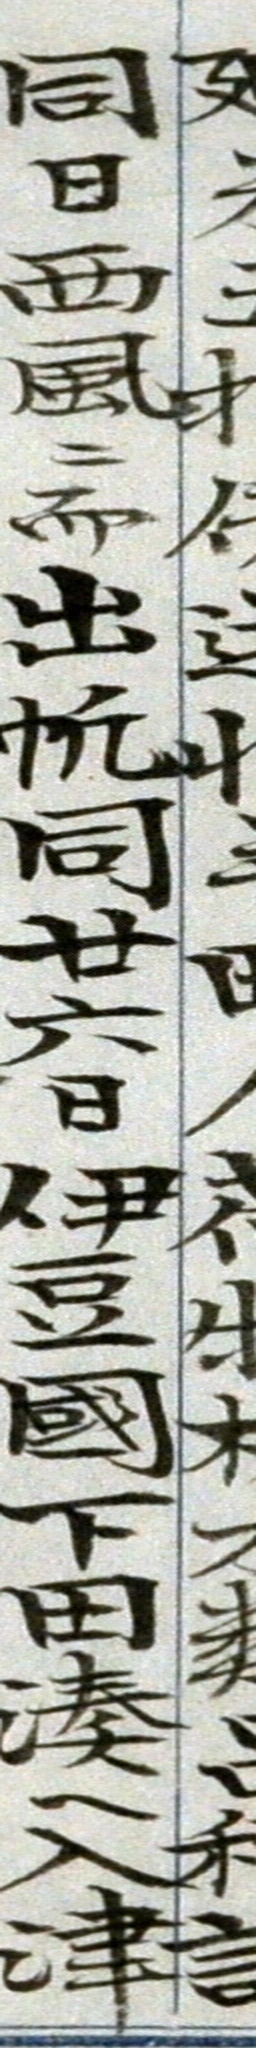同日西風に而出帆同廿六日伊豆国下田湊へ入津
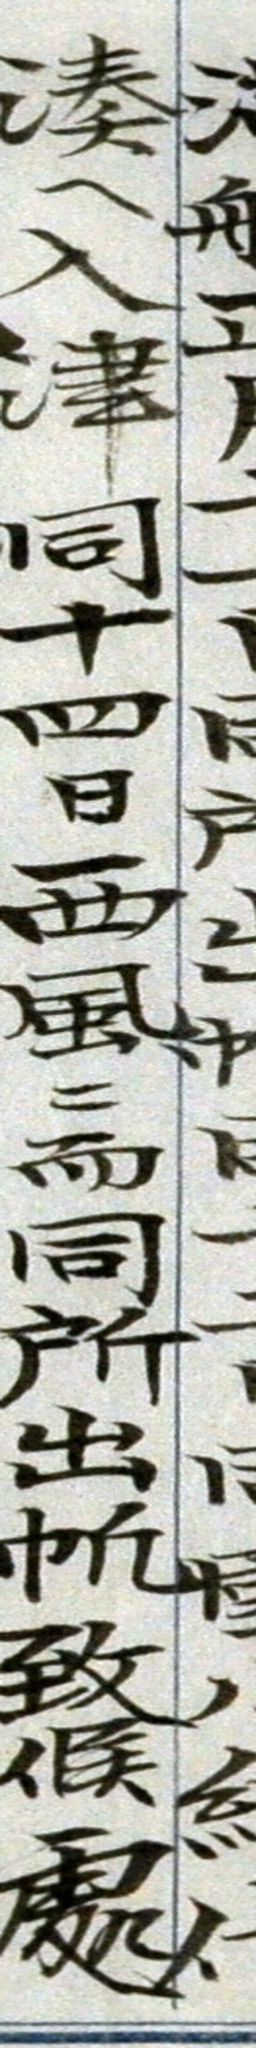湊へ入津同十四日西風に而同所出帆致候處
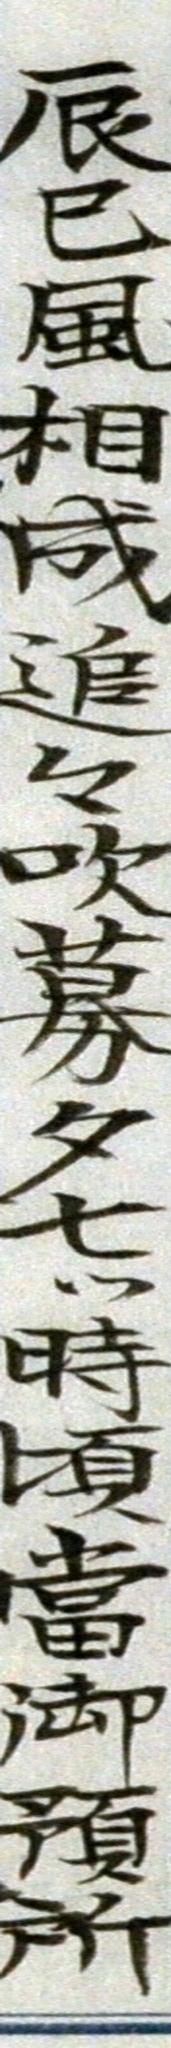辰巳風相成追々吹募夕七ッ時頃当御預所
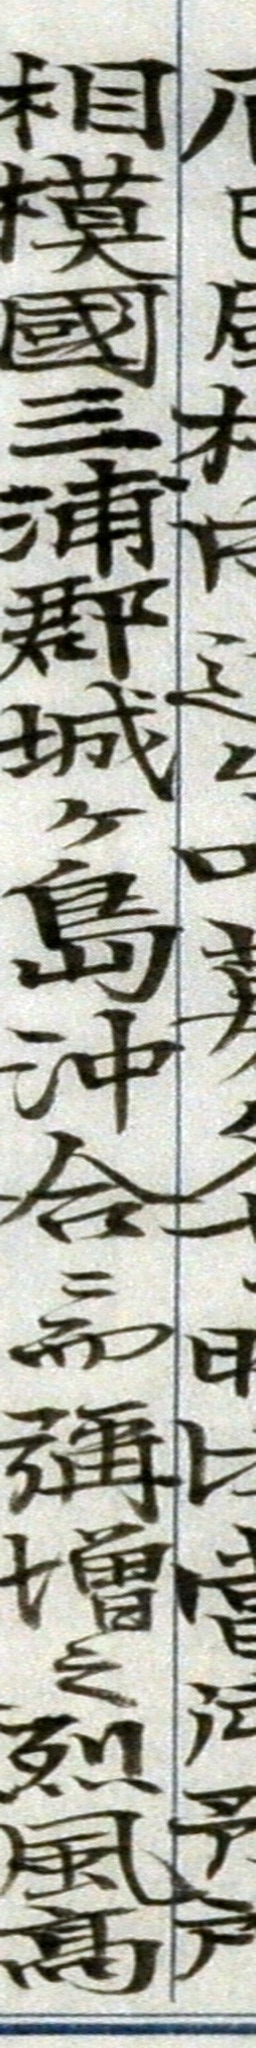相模国三浦郡城ヶ島沖合に而弥増之烈風高
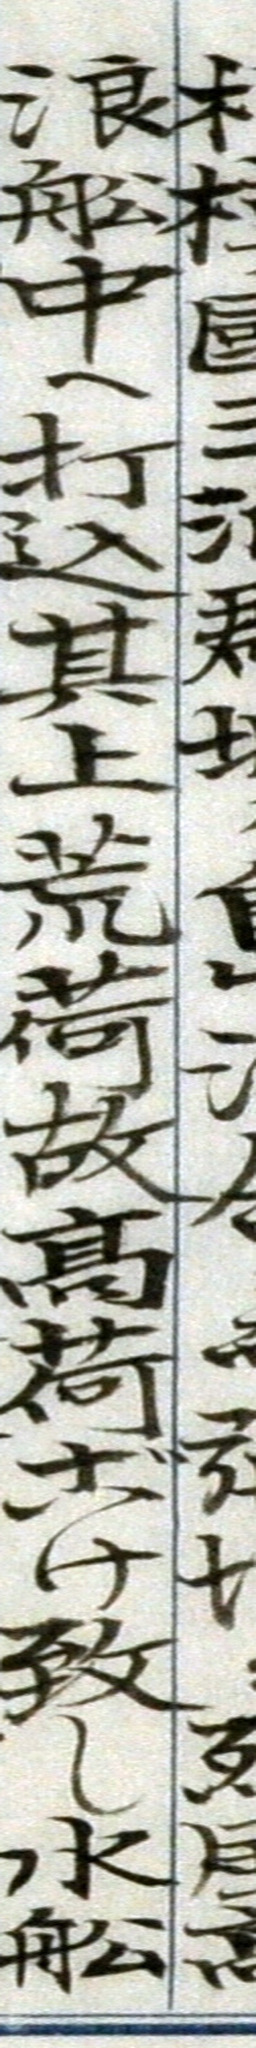浪船中へ打込其上荒荷故高荷こけ致し水船
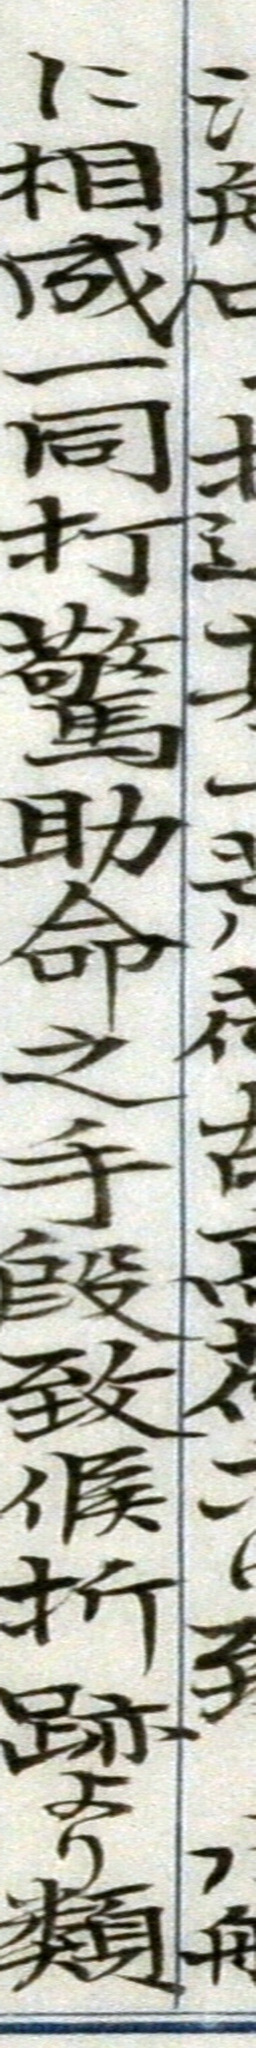に相成一同打驚助命之手段致候折跡より類
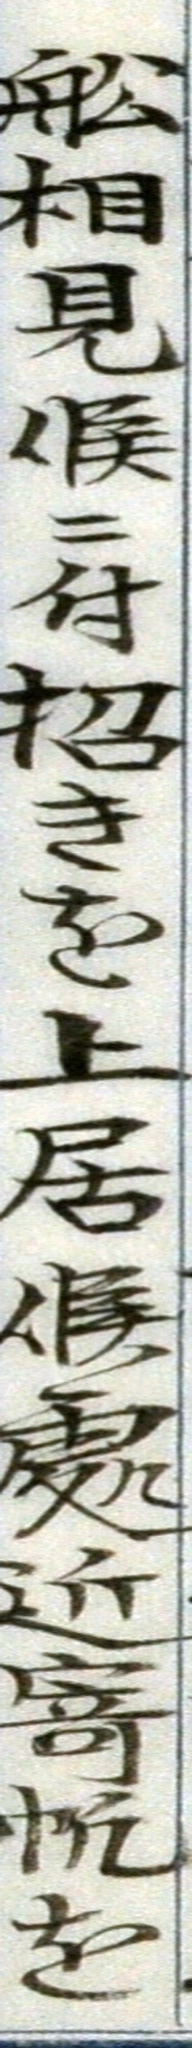船相見候に付招きを上居候處近寄帆を
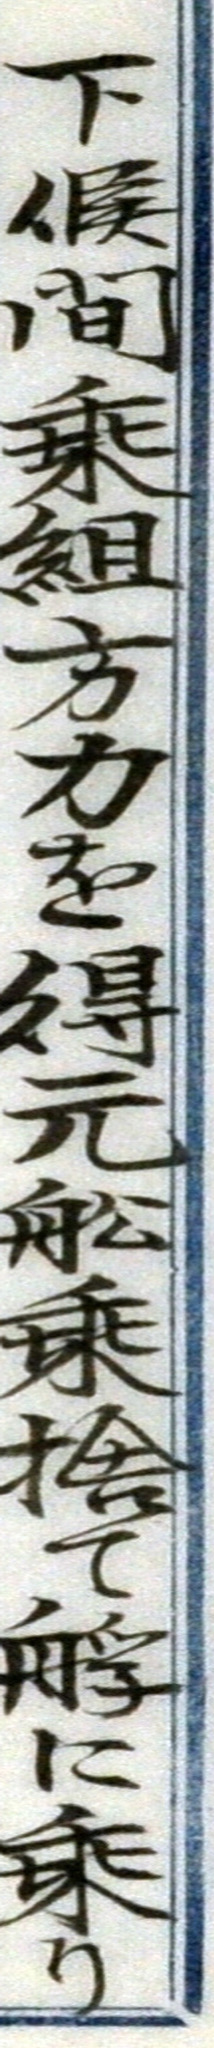下候間乗組方力を得元船乗捨て艀に乗り
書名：御廻米難船始末
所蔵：伊那市立高遠町図書館・合同会社AMANE
